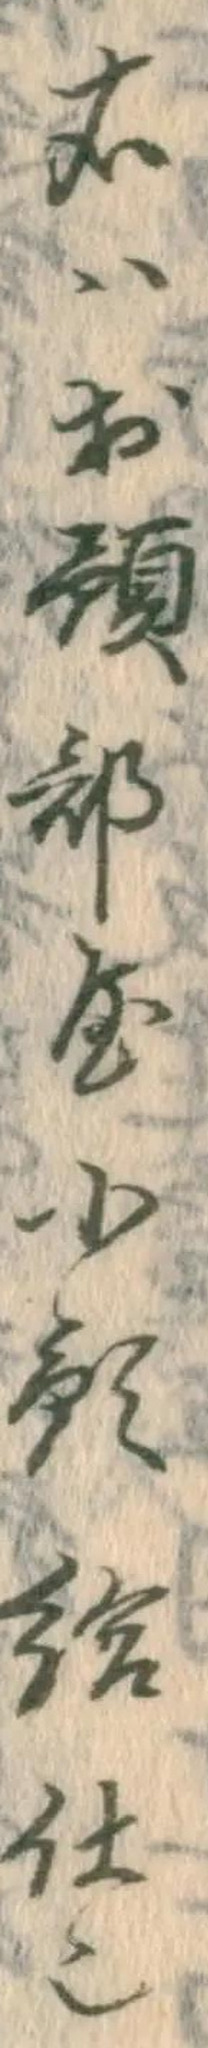右ハ於預部屋小願給仕也
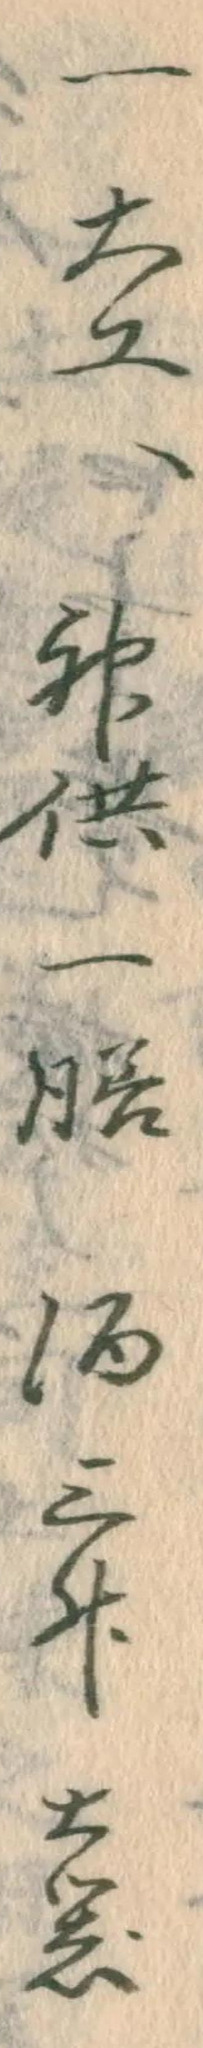一大工へ神供一膳酒三升土器
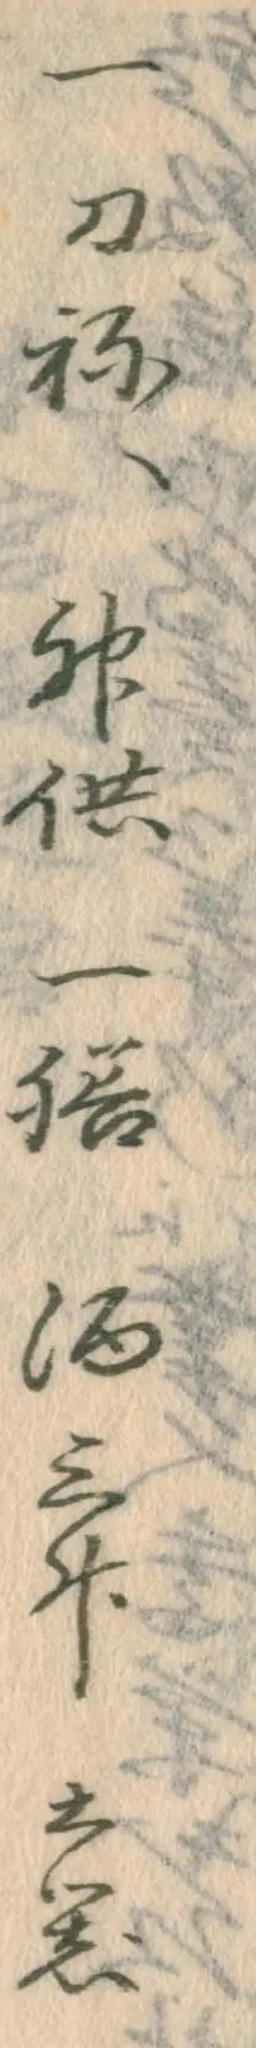一刀祢へ神供一膳酒三升土器
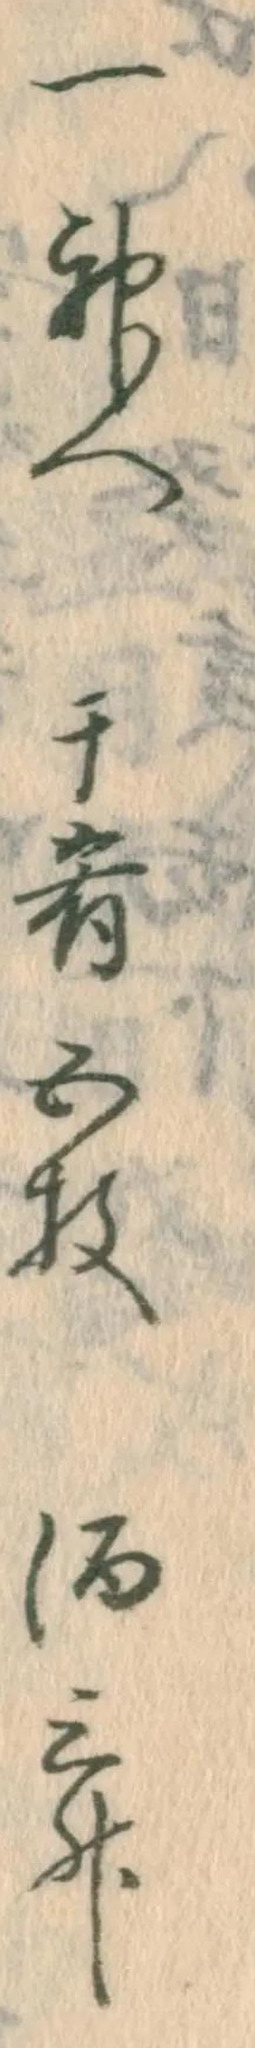一神人干肴五枚酒三升
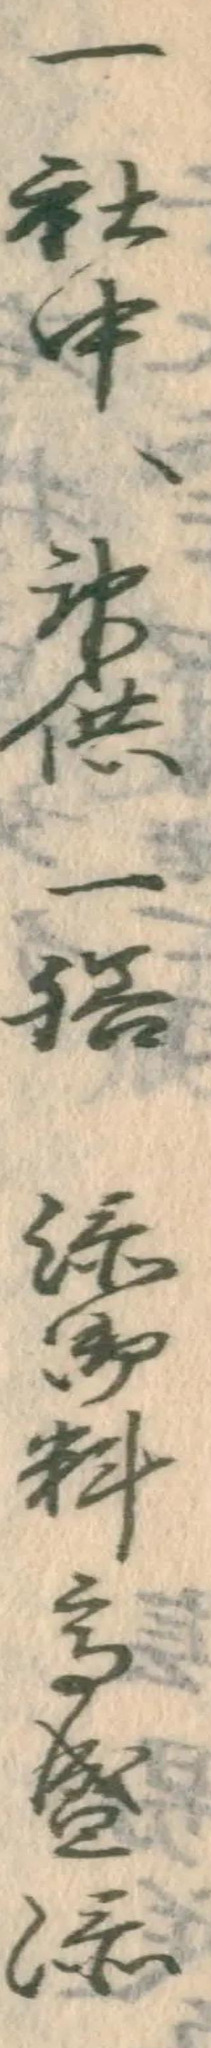一社中へ神供一膳添御料高盛添
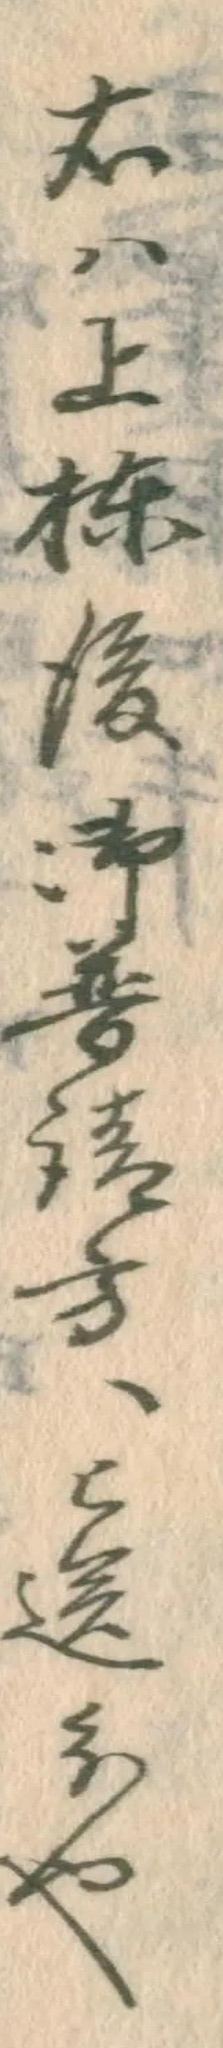右ハ上棟後御普請方へ被送分也
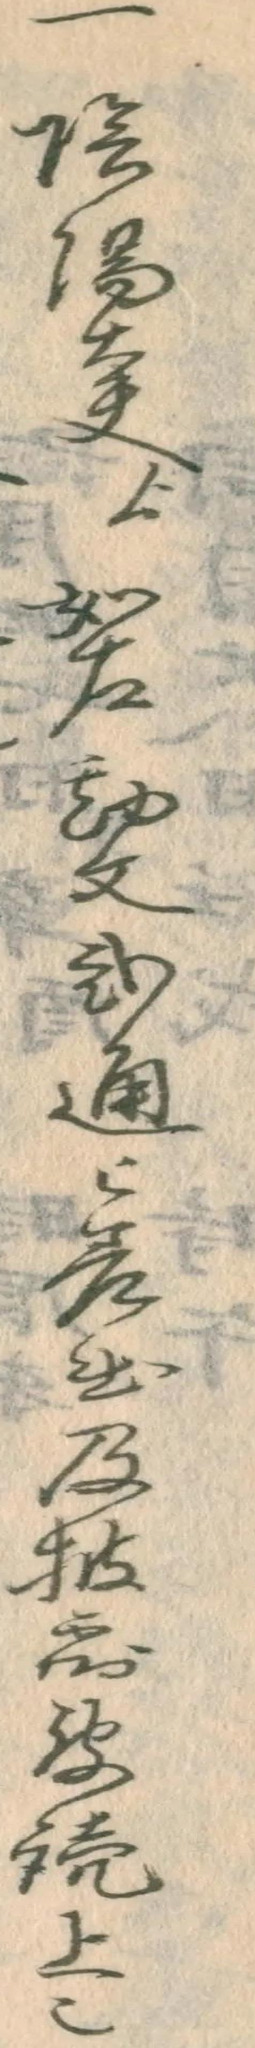一陰陽大夫ゟ如左勘文弐通被差出及披露致読上也
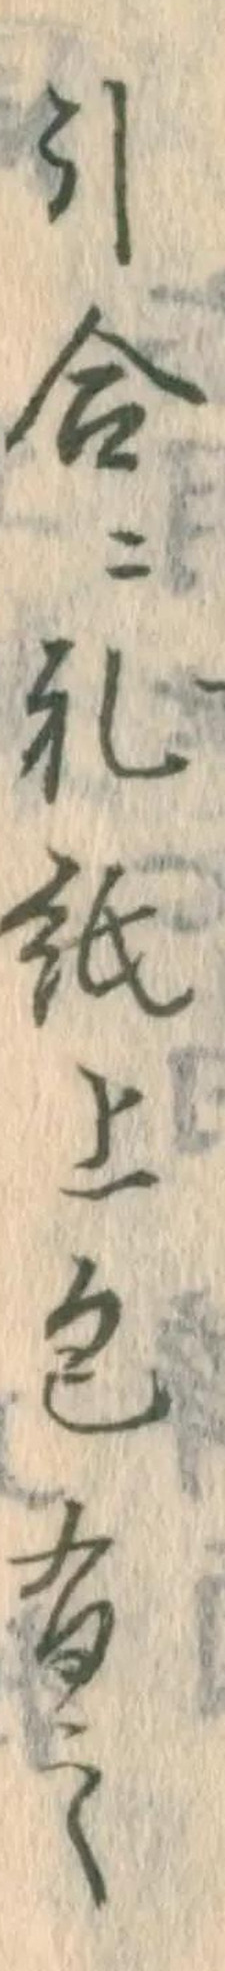引合ニ礼紙上包有之
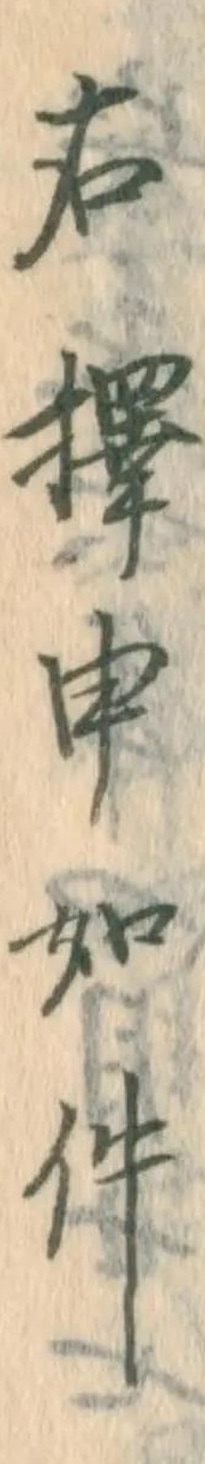右択申如件

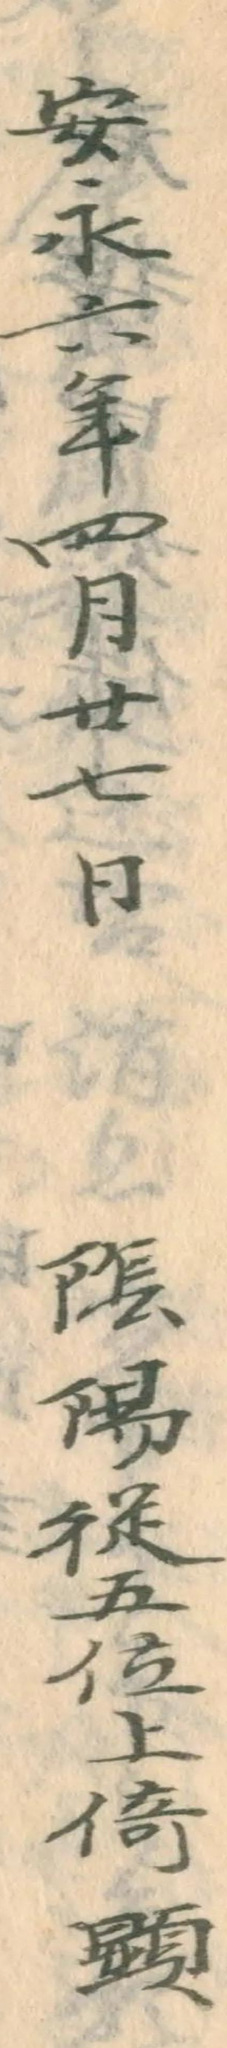安永六年四月廿七日陰陽従五位上倚顕
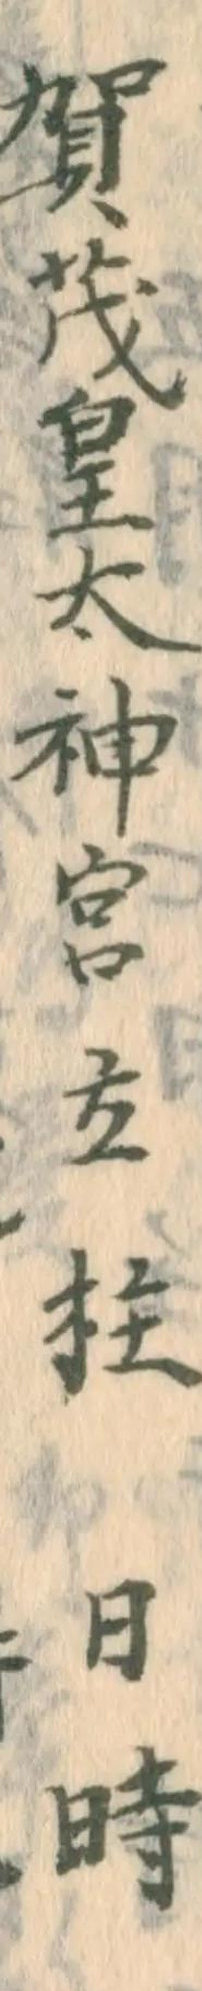賀茂皇太神宮立柱日時
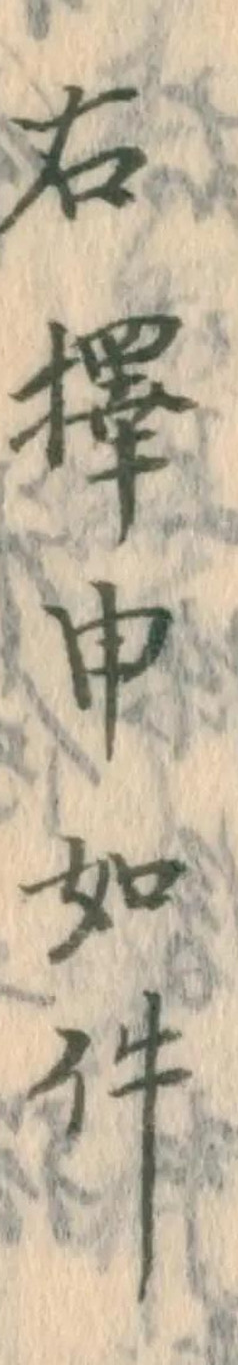右択申如件
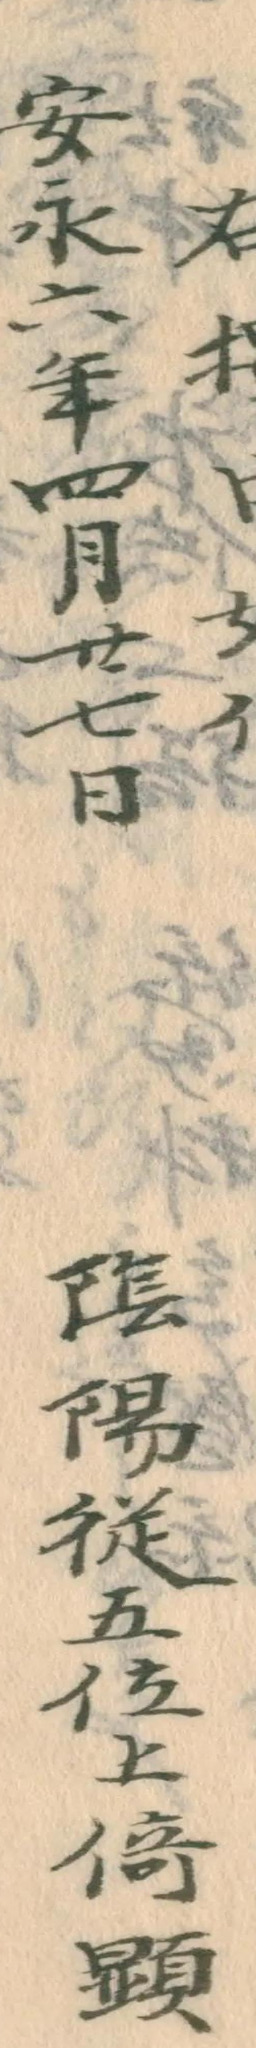安永六年四月廿七日陰陽従五位上倚顕
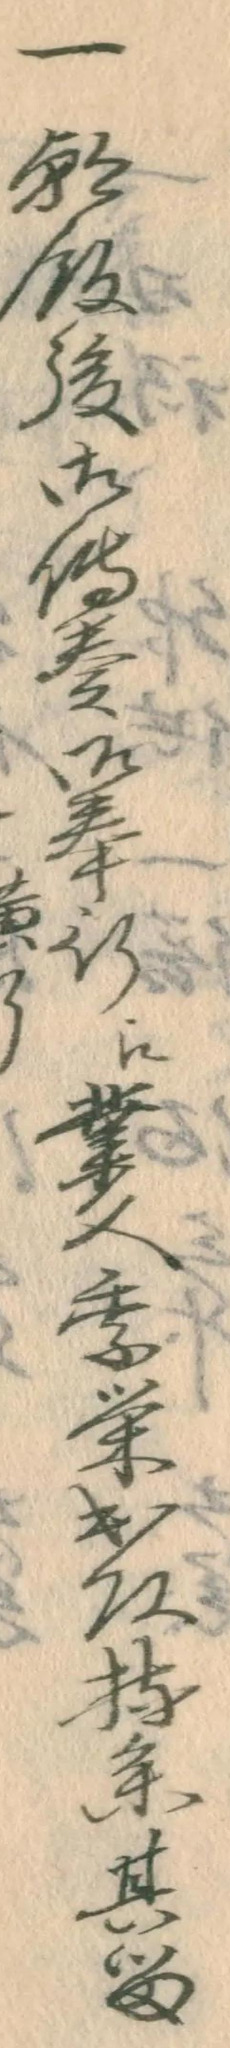一朝飯後御伝奏御奉行江業久季栄出頭持参其留
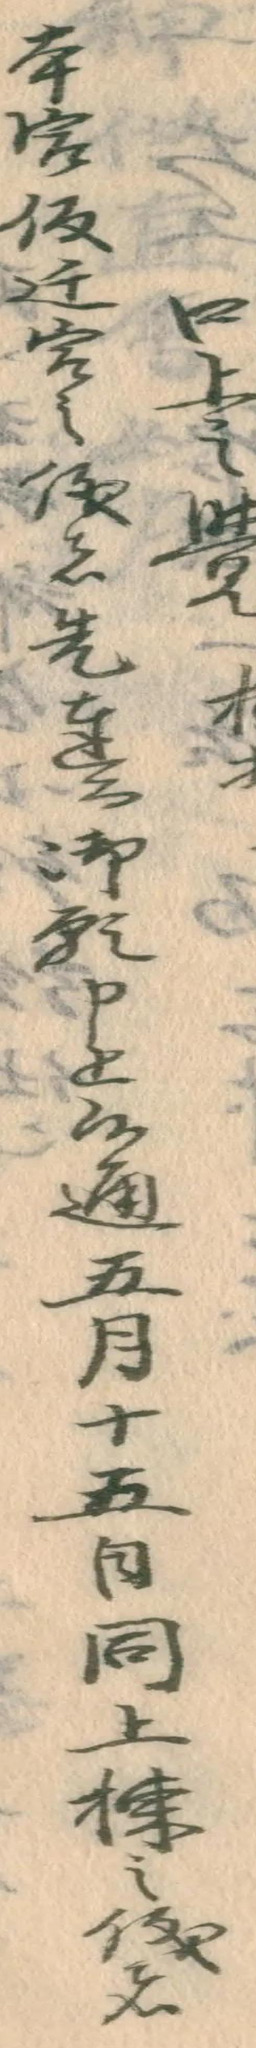本宮仮迁宮之儀は先達而御願申上候通五月十五日同上棟之儀は
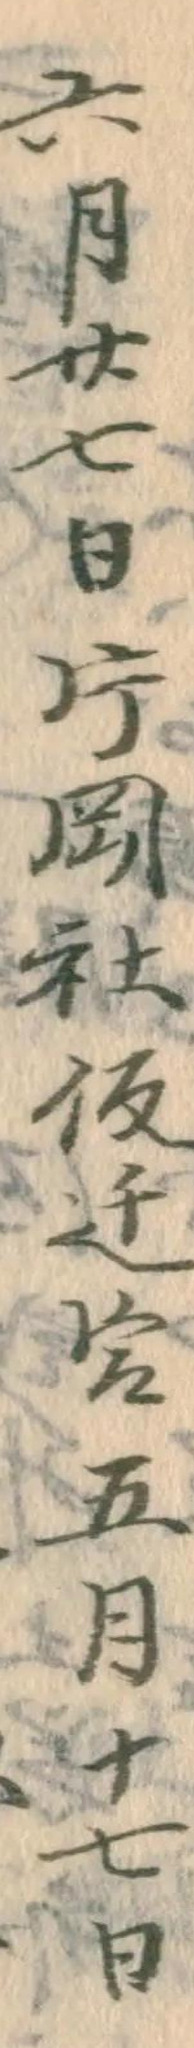六月廿七日片岡社仮迁宮五月十七日
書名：賀茂社記録. 第17冊
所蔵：国立国会図書館 National Diet Library, JAPAN
